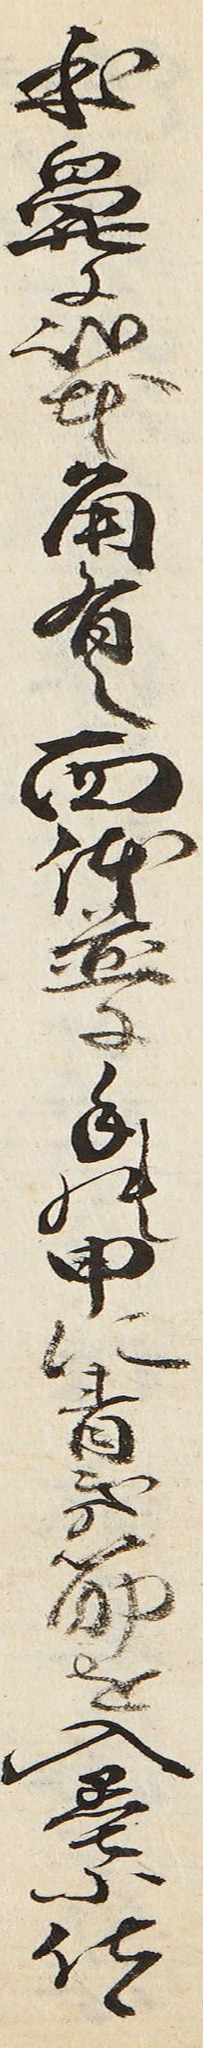本鼻に弐本角有之面体並に手の甲に青き筋を入墨に仕候
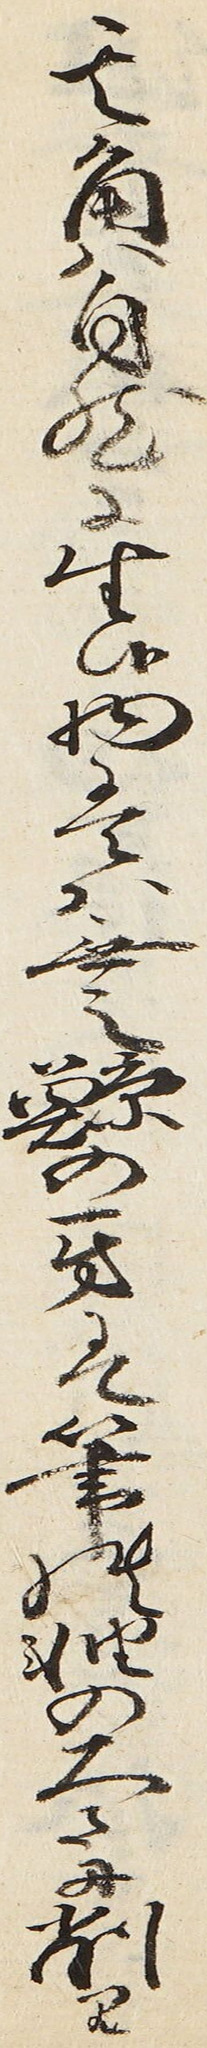其角は自然に生候物にては無之鯨の牙にて筆の軸の大さに削り
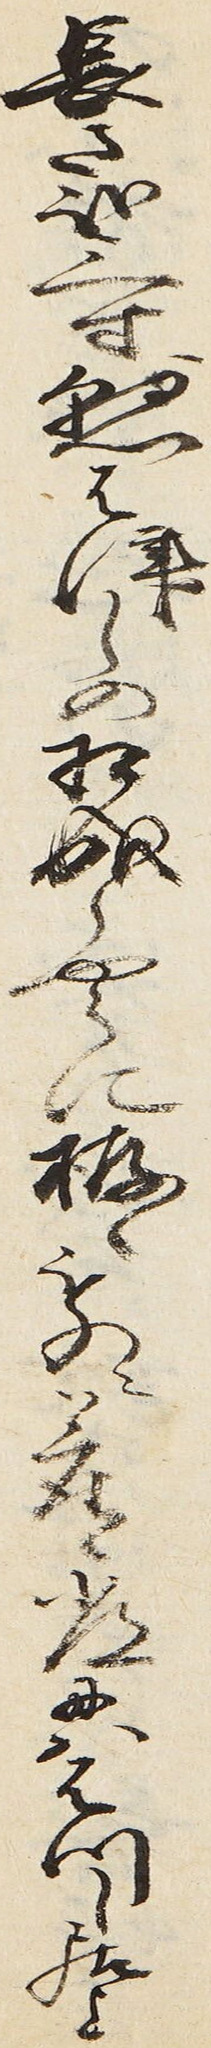長さ弐三寸懸はつしの相成しやうに拵候ものに御座候常にははつし居申候
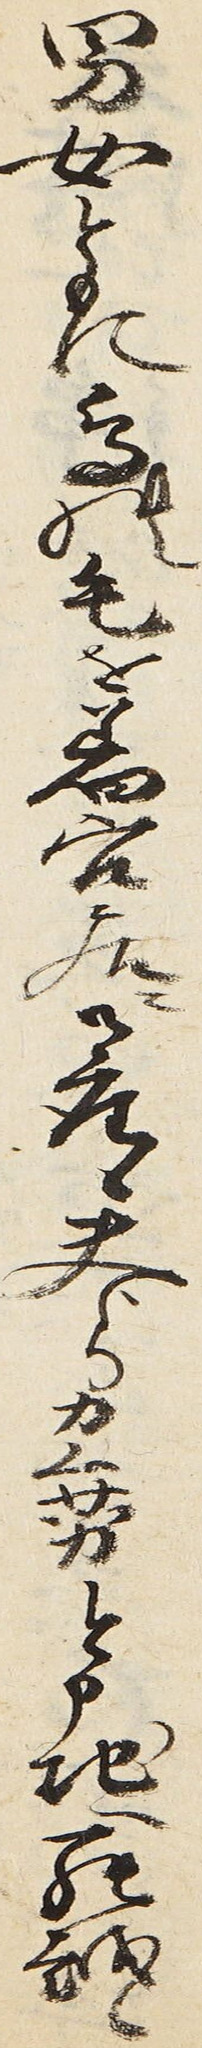男女ともに鳥の毛を着穴居に御座候夫よりカムサツカと申地へ罷越候
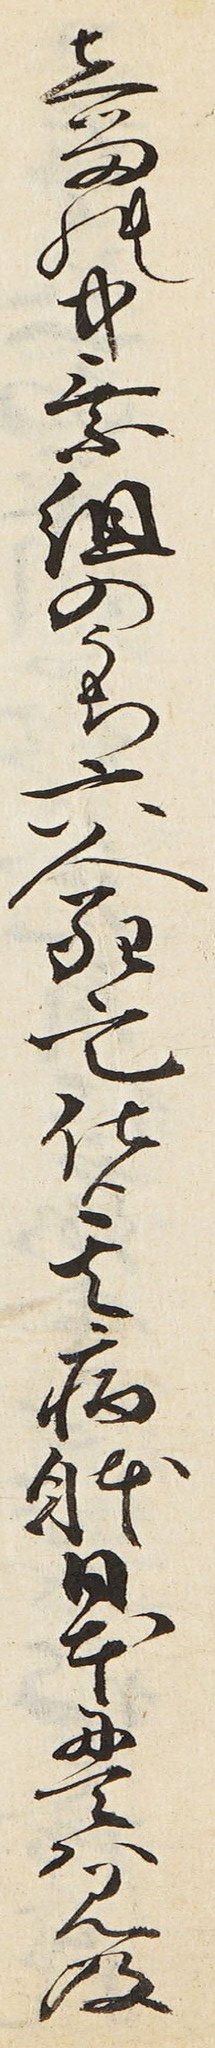在留の中乗組のうち六人死亡仕候其病躰日本にては見及
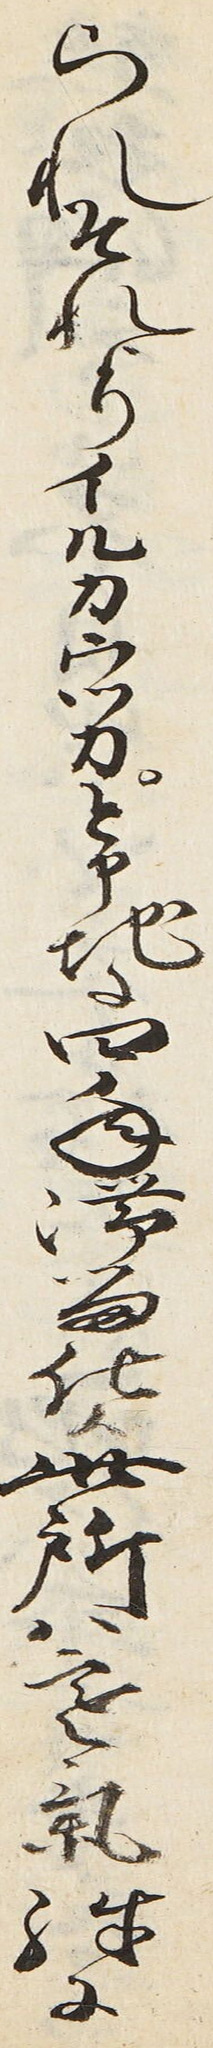られそれよりイルカウツカ。と申地に四年滞留仕候此所は寒気殊に
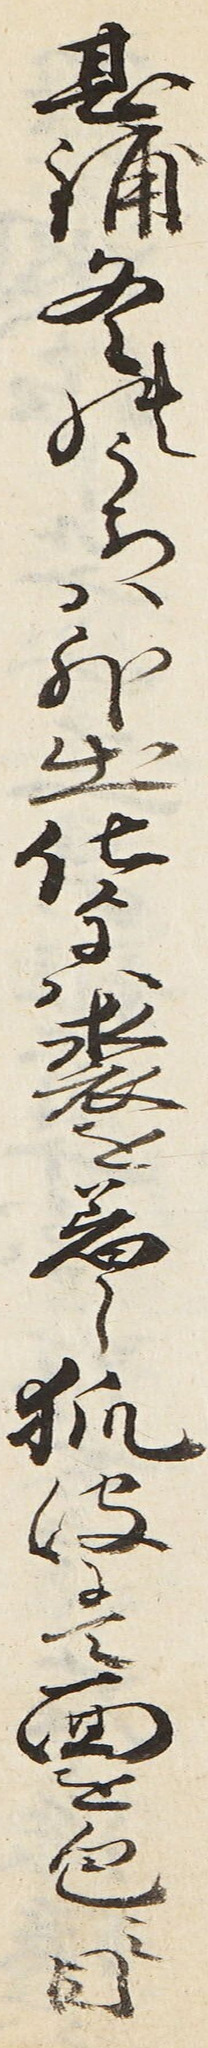甚鋪冬のうちは外出仕候には裘を着し狐皮ににて面を包み目
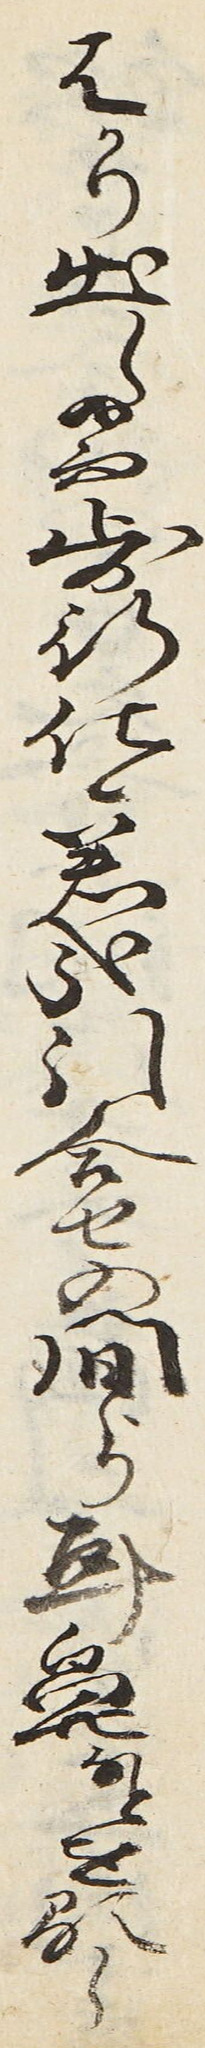はかり出し候て歩行仕候若哉引合わせの間より耳鼻なとを顕し
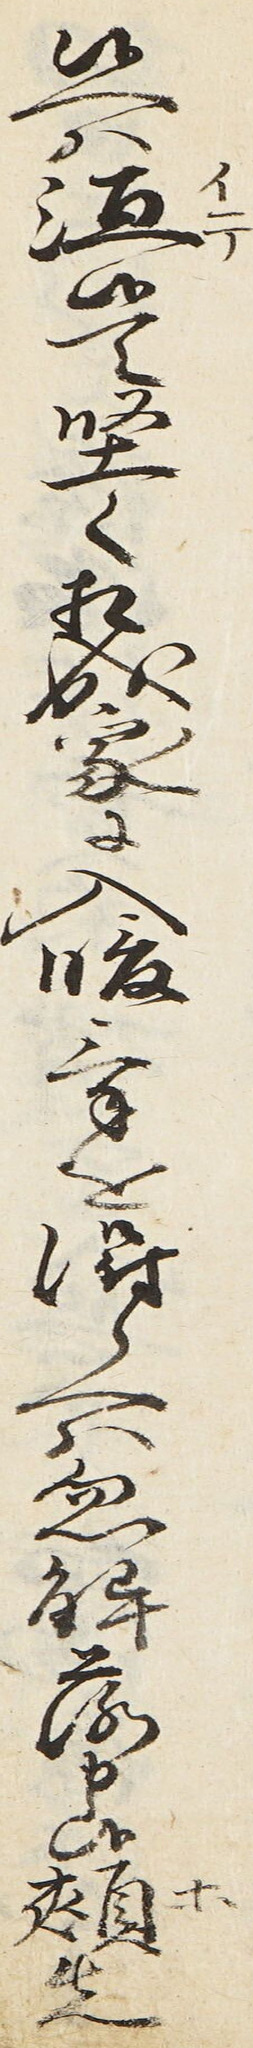候へは冱候て堅く相成り家に入暖気を得候へは忽解落申候頬先
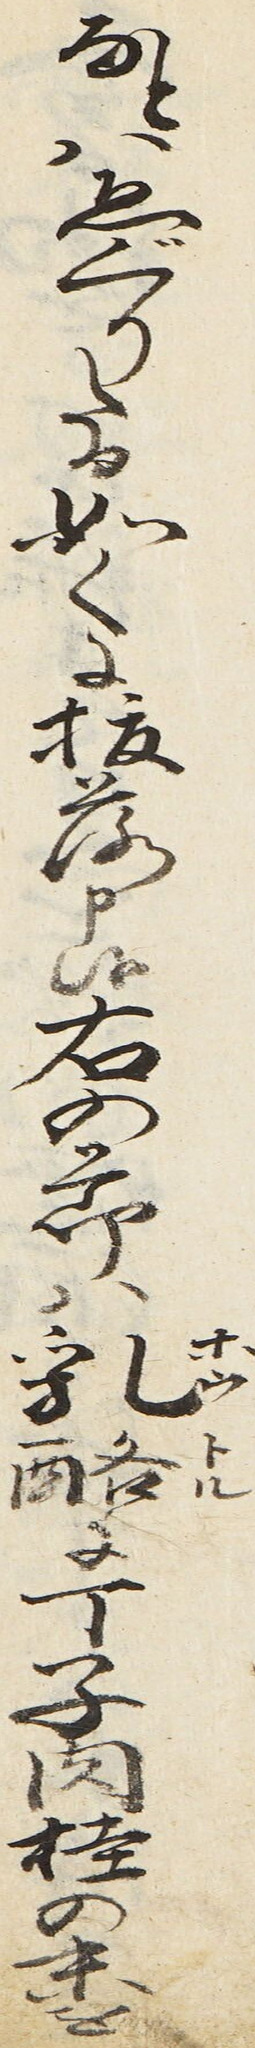なとはゑぐりたる如くに抜落申候右の節は乳酪に丁子肉桂の末を
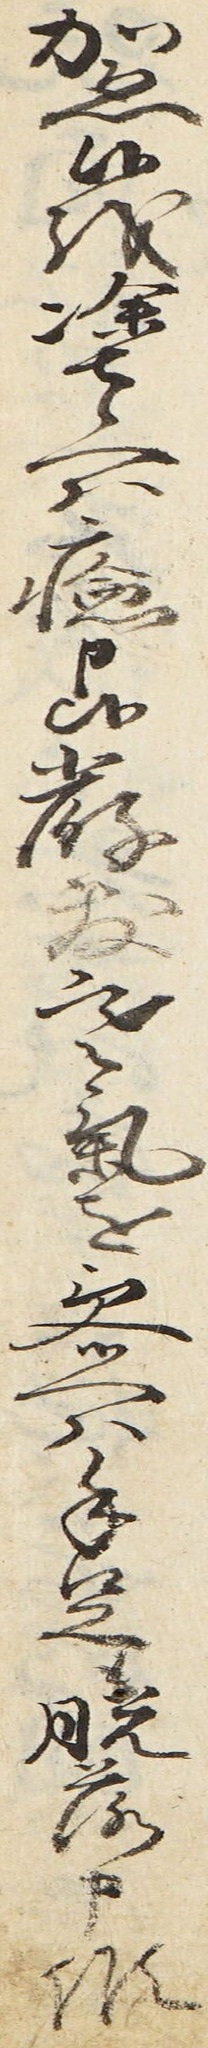加ゑ候を塗候へは癒申候厳敷寒気を受候へは手足も脱落申候

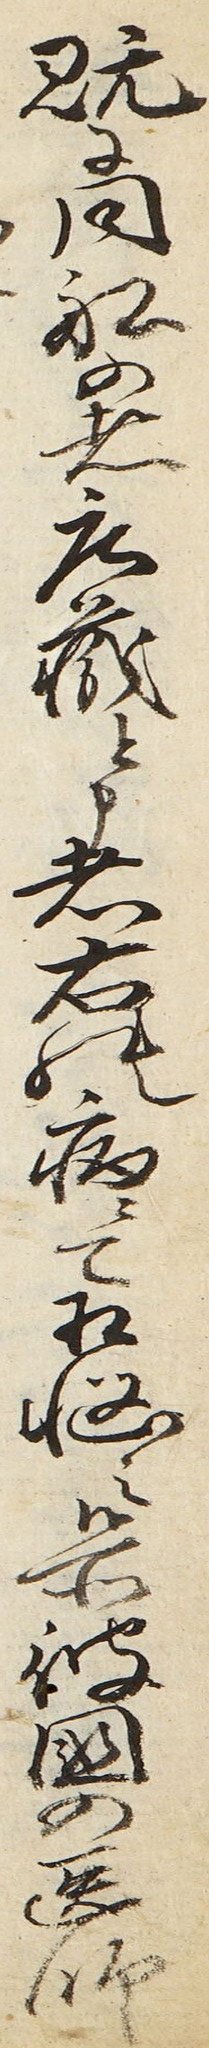既に同船の者庄蔵と申者右の病にて相悩み候所彼国の医師
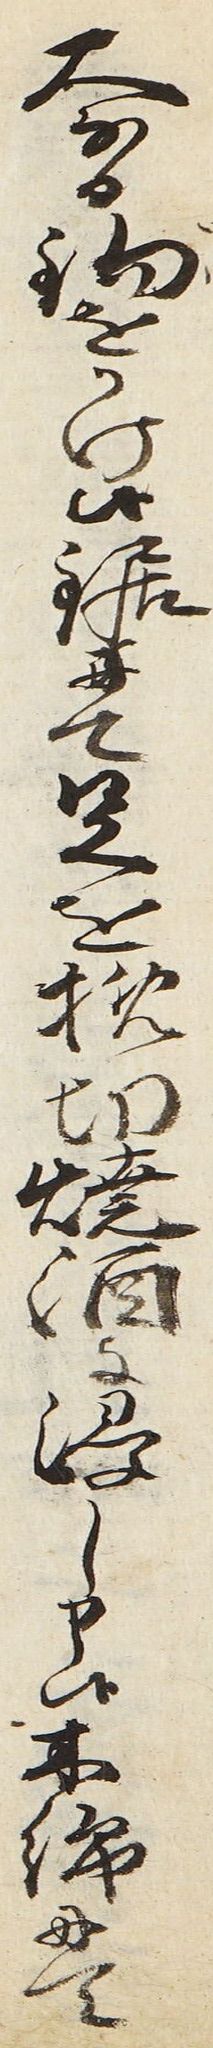大なる釣をかけ候鋸にて足を挽切焼酎に浸し申候木綿にて
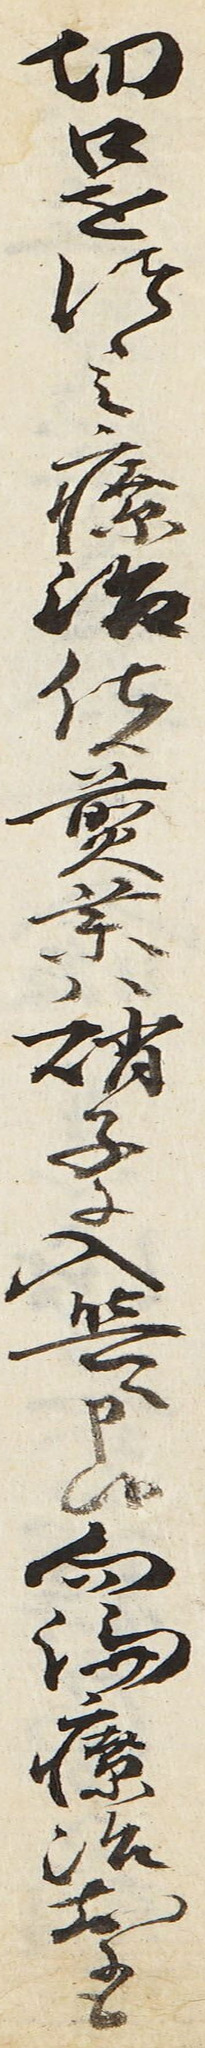切口をつゝみ療後仕候煎薬は硝子に入与へ申候勿論療治前にも
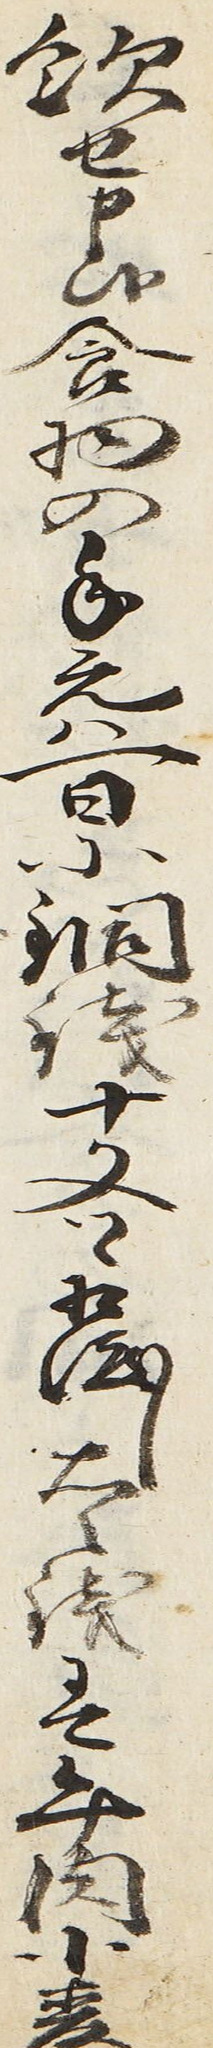飲せ申候食物の手元は一日に銅銭十文つゝ相渡し右の銭にて牛肉小麦
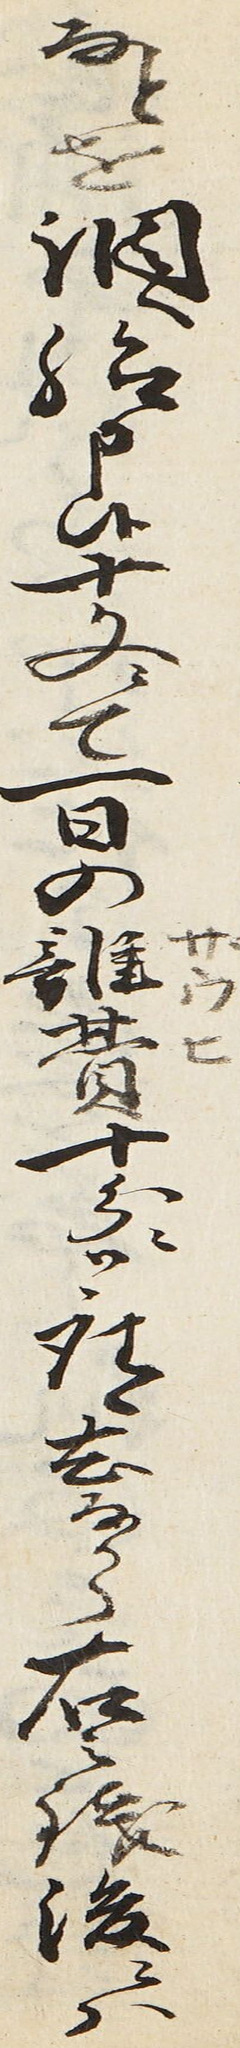なとを調へ始申候十文にて一日の雑費十分に御座候去なから右之銭後には
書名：漂民御覧之記
